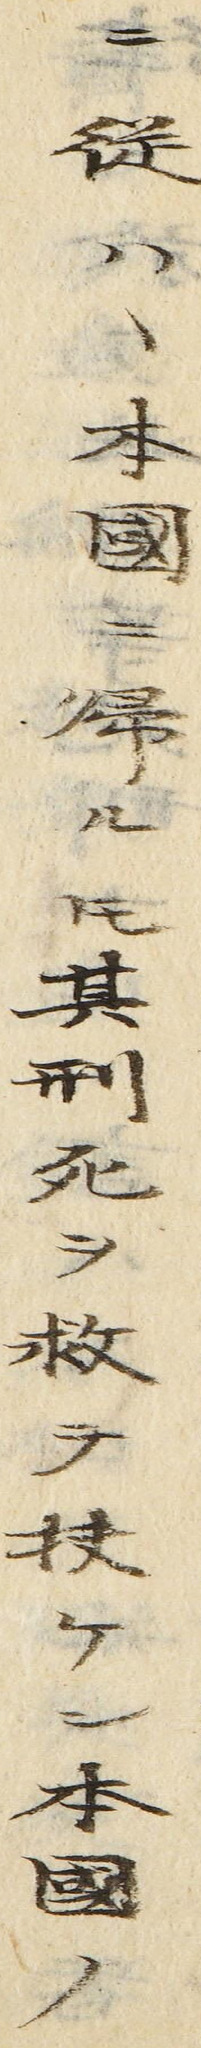ニ従ハヽ本国ニ帰ルトモ其刑死ヲ救テ扶ケン本国ノ

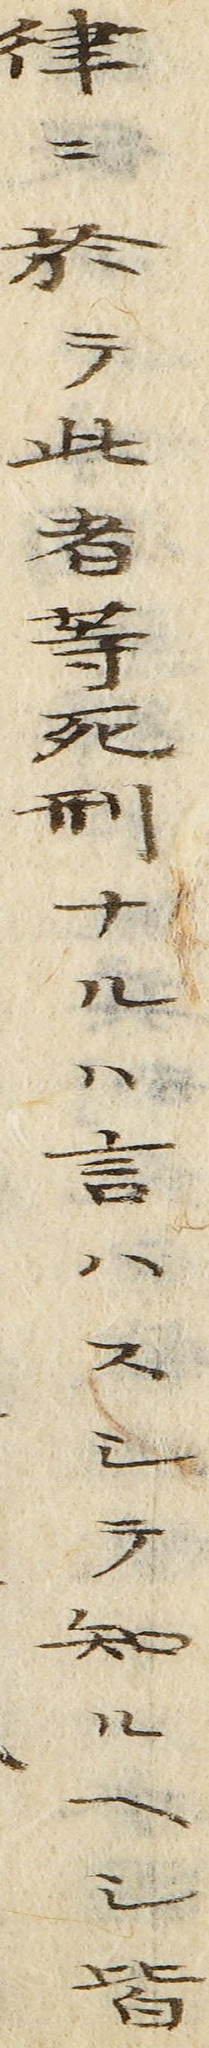律ニ於テ此者等死刑ナルハ言ハスシテ知ルヘシ皆
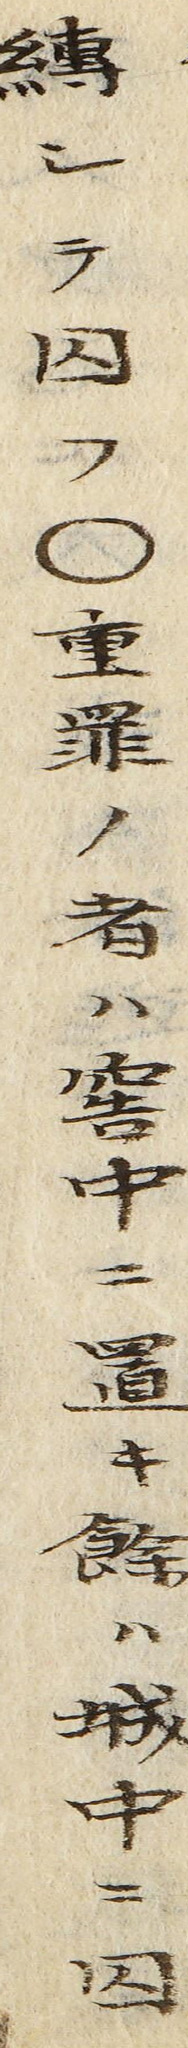縛シテ囚フ◯重罪ノ者ハ窖中ニ置キ余ハ城中ニ囚
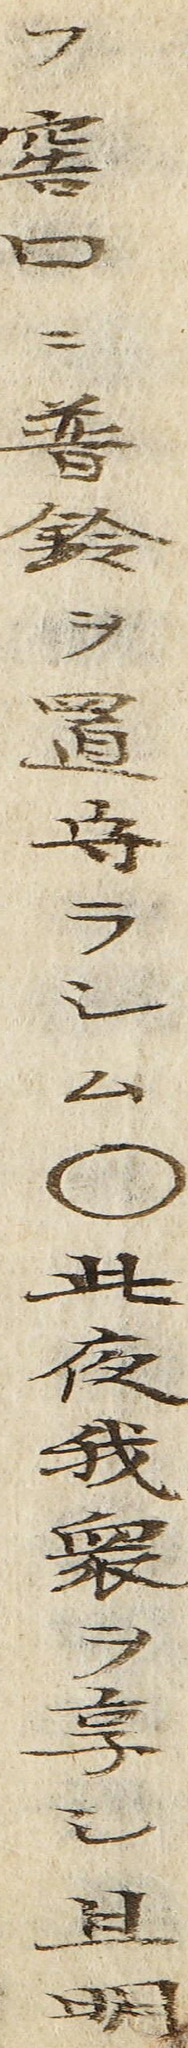フ窖口ニ普鈴ヲ置守ラシム◯此夜我衆ヲ享シ且明
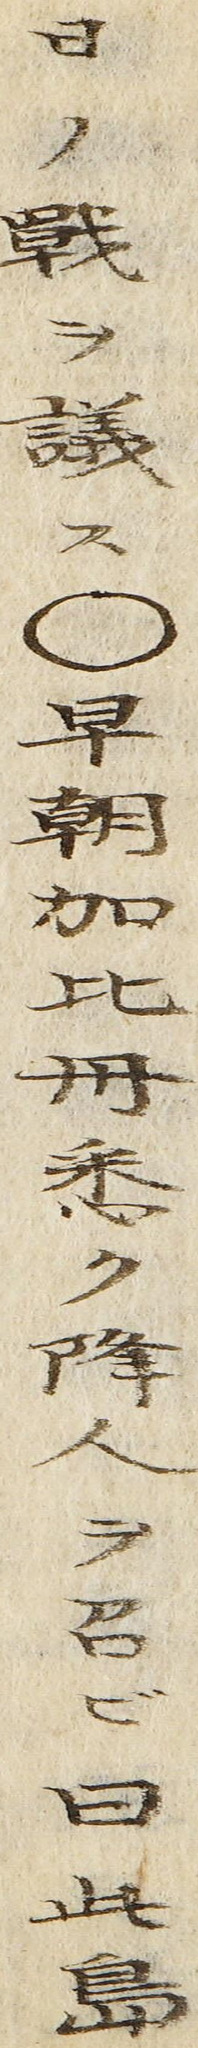日ノ戦ヲ議ス◯早朝加比丹悉ク降人ヲ召ビ曰此島
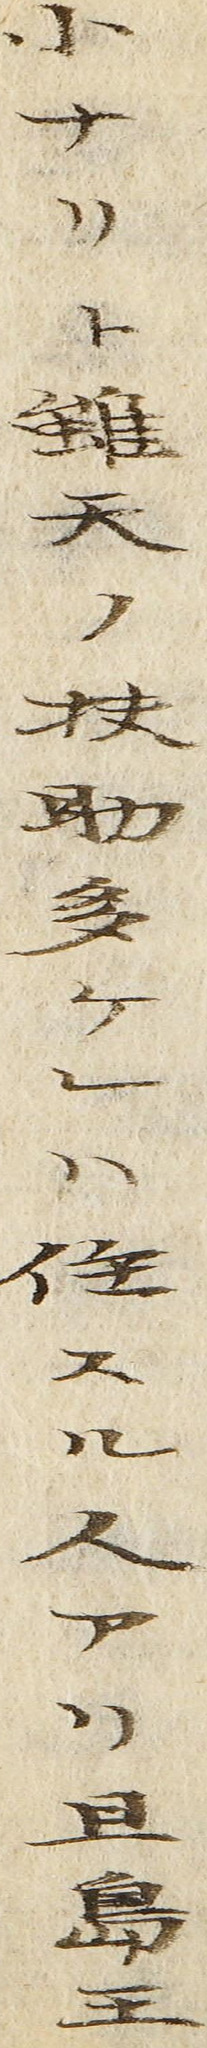小ナリト雖天ノ扶助多ケレハ住スル人アリ且島王
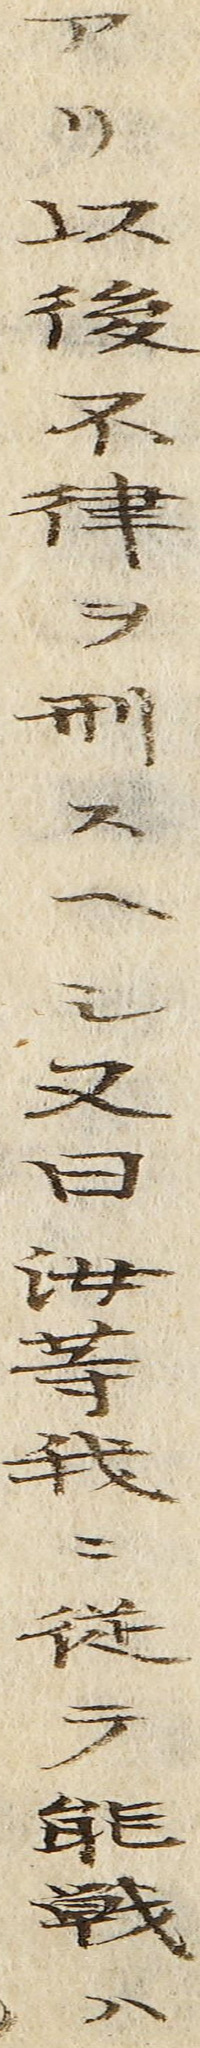アリ以後不律ヲ刑スヘシ又曰汝等我ニ従テ能戦ハ
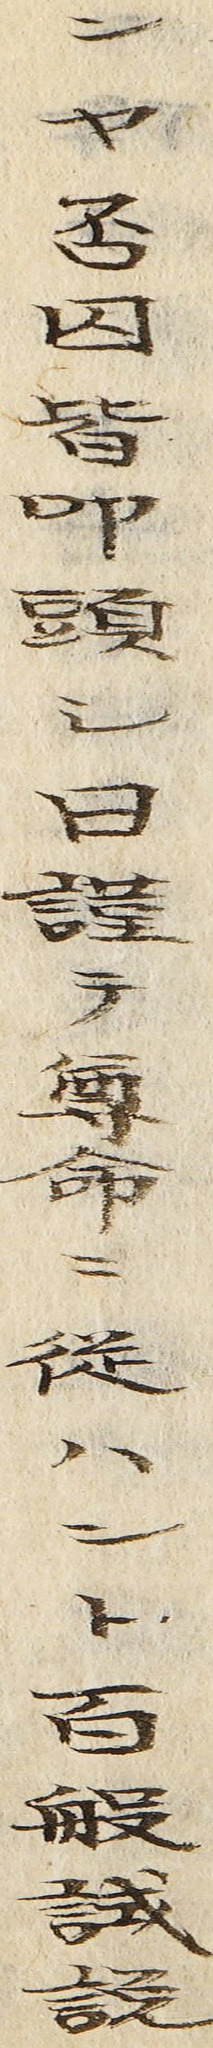ンヤ否囚皆叩頭シ曰謹テ尊命ニ従ハント百般試説
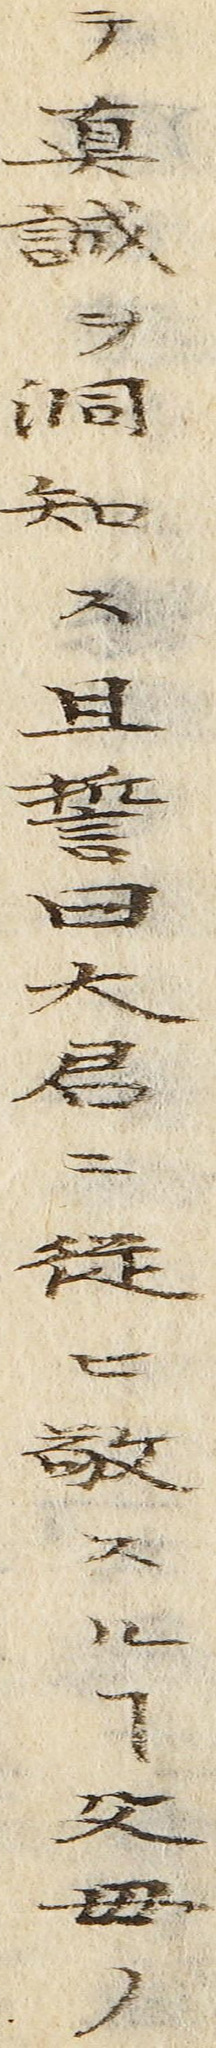テ真誠ヲ洞知ス且誓曰大君ニ従ヒ敬スルコト父母ノ
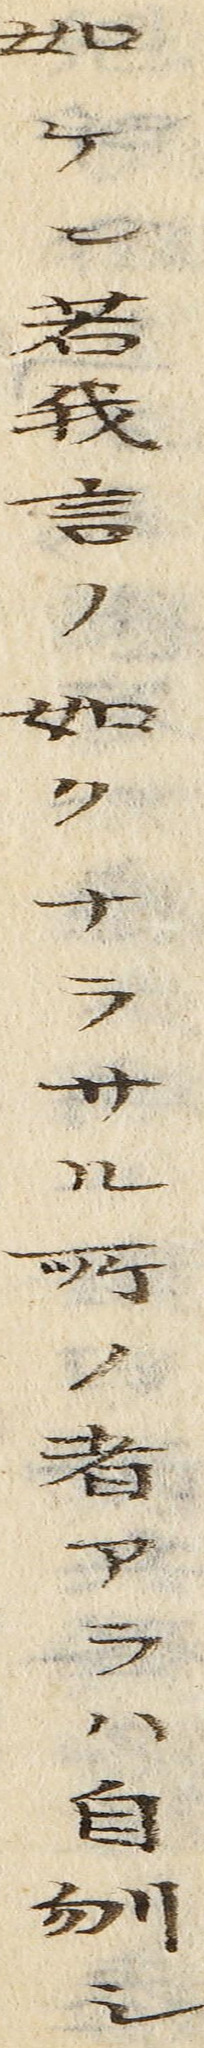如ケン若我言ノ如クナラサル所ノ者アラハ自刎シ
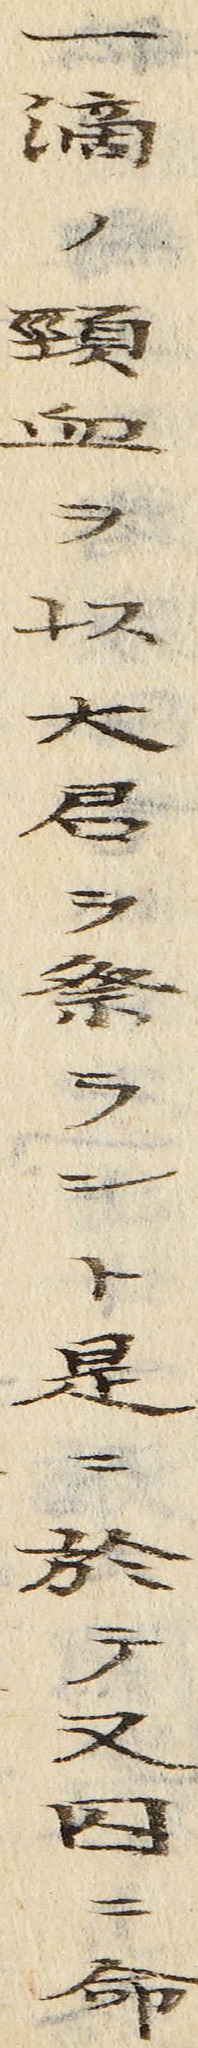一滴ノ頸血ヲ以大君ヲ祭ラント是ニ於テ又囚ニ命
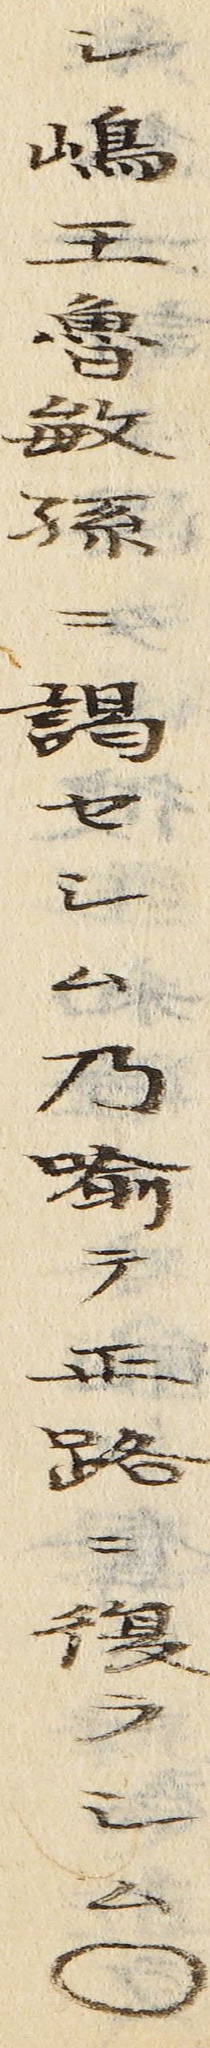シ嶋王魯敏孫ニ謁セシム乃喩テ正路ニ復ラシム◯
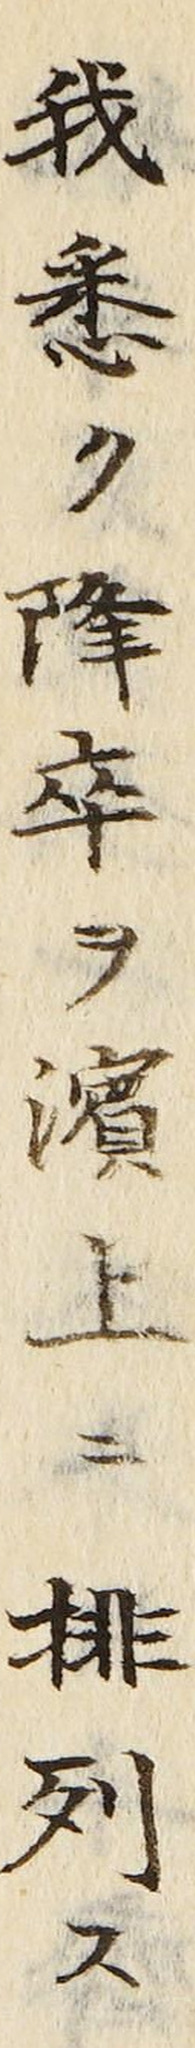我悉ク降卒ヲ浜上ニ排列ス
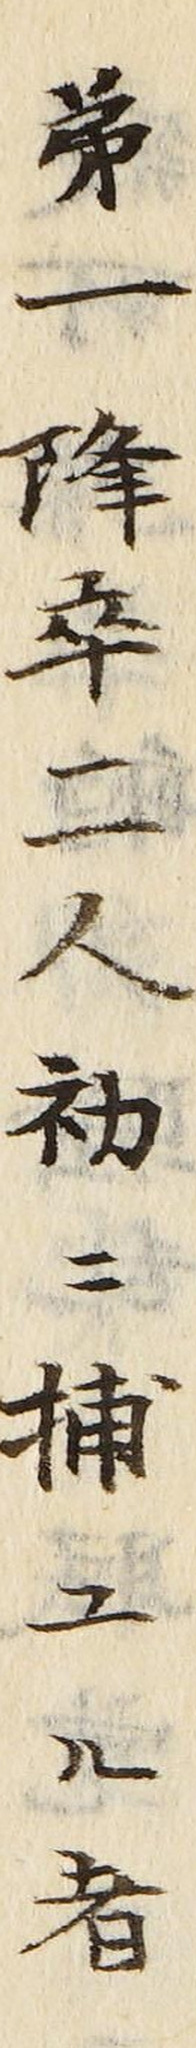第一降卒二人初ニ捕ユル者
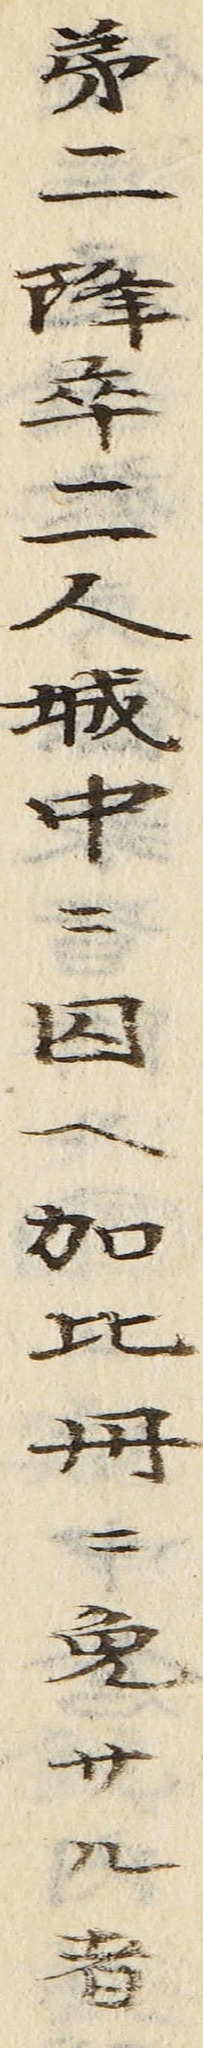第二降卒二人城中ニ囚ヘ加比丹ニ免サル者
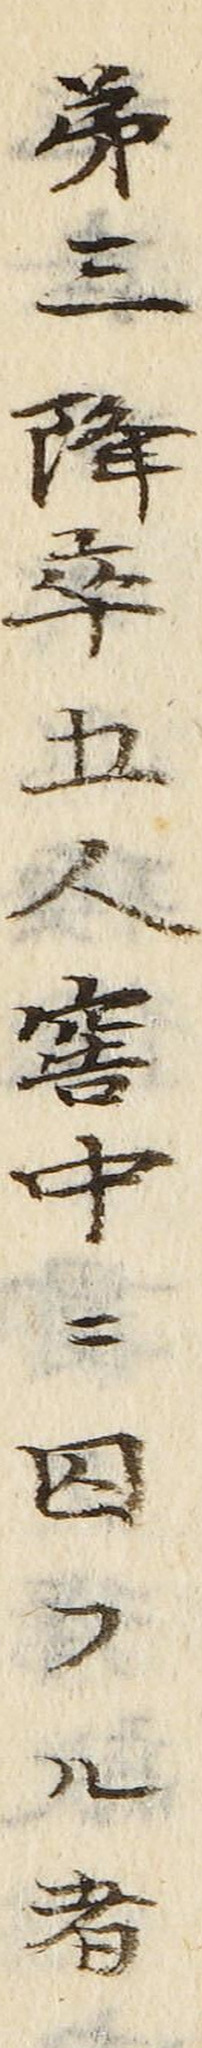第三降卒五人窖中ニ囚フル者
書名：漂流紀事
